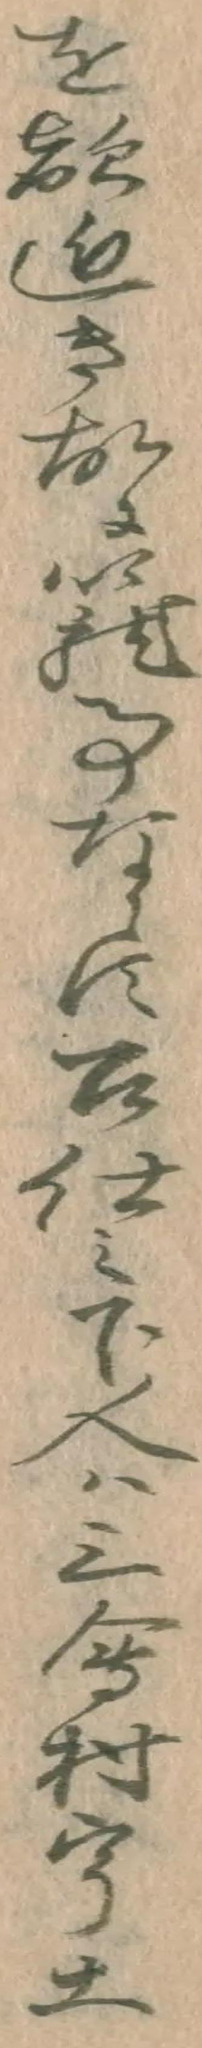を敵近き故に籠事ならす召仕之下人は三会村宇土
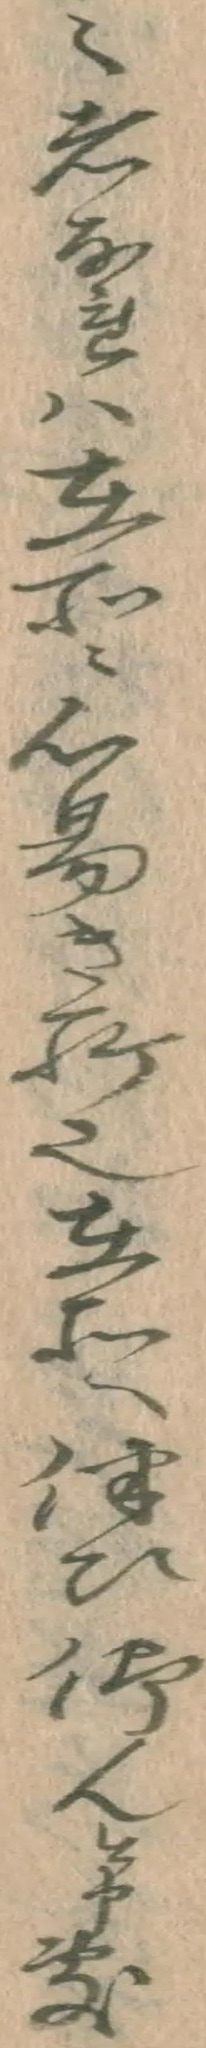之者なれは在所に心易き所也在所へ伴ひ仰んと申処
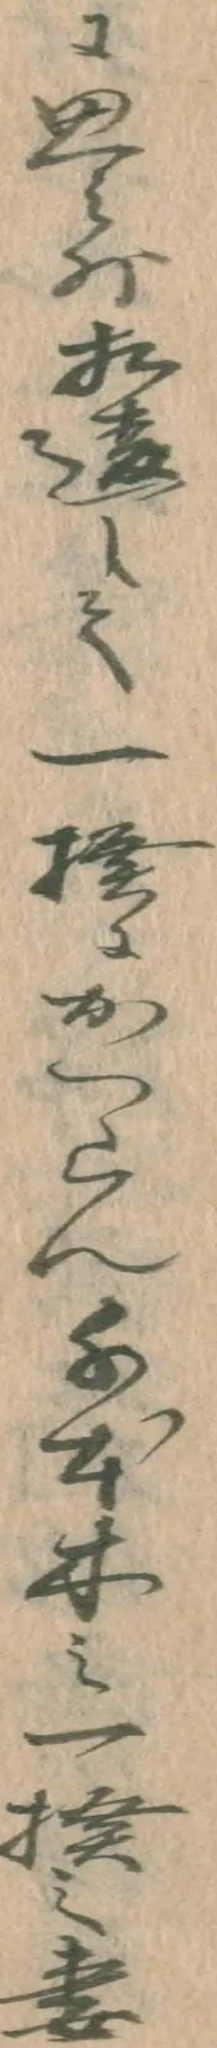に思之外相違して一揆にかへらん千本木之一揆之妻
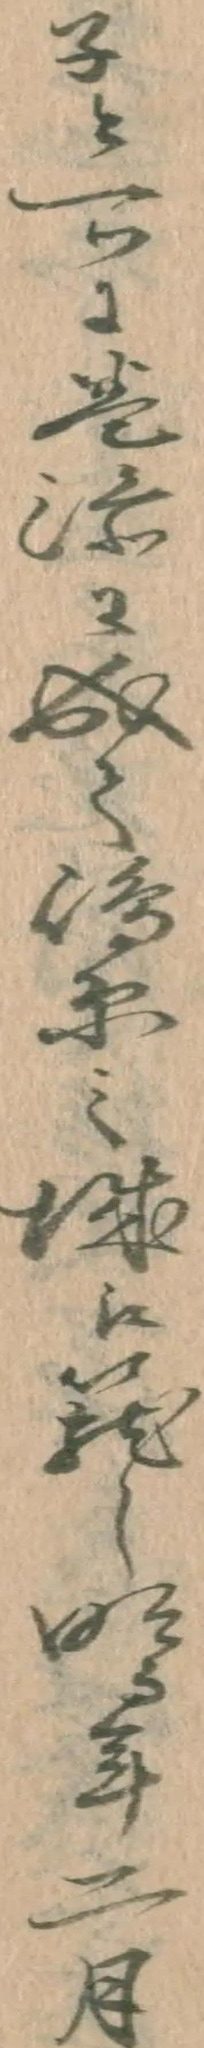子と一つに巻添に成て島原之城え籠し明る年二月
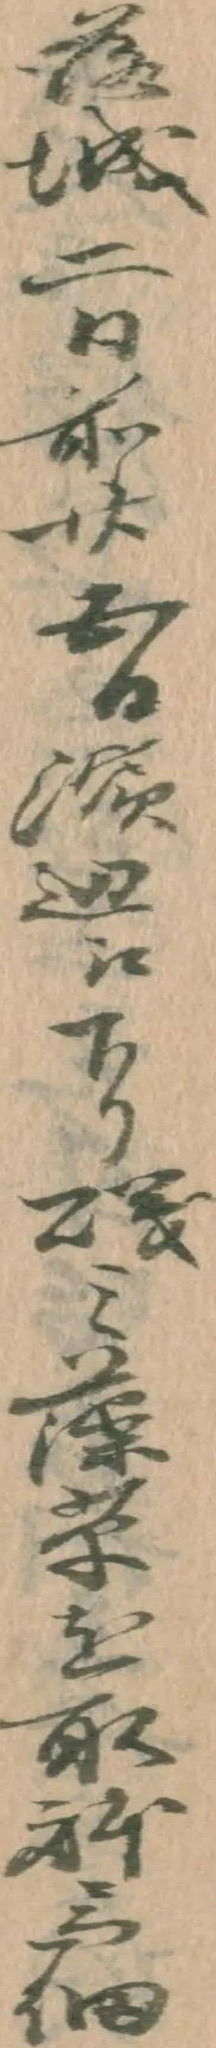落城二日前廿五日浜辺え下り磯之藻草を取体に而細
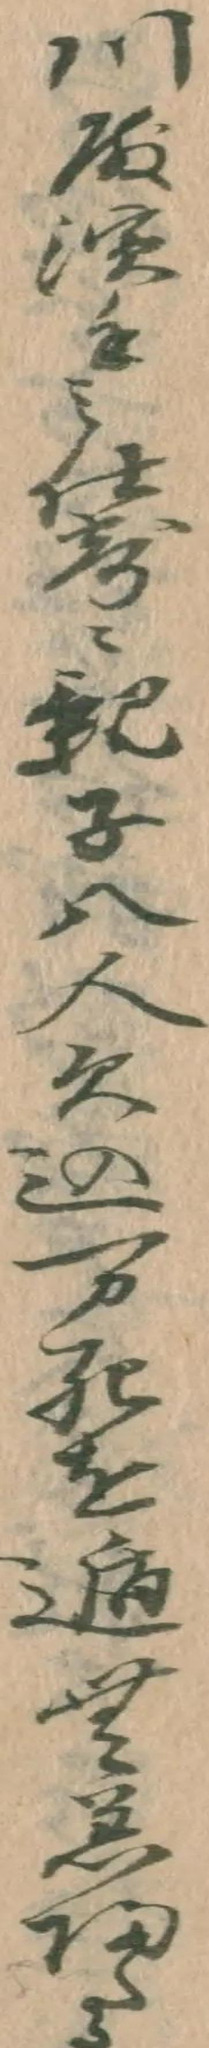川殿浜手之仕奇に親子八人欠込万死を遁無急帰たる
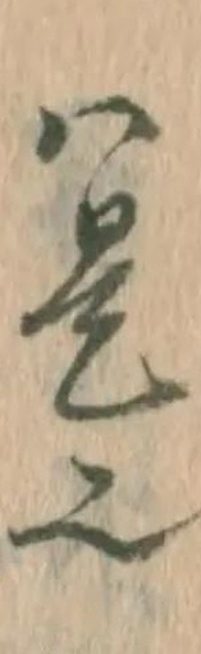は是也
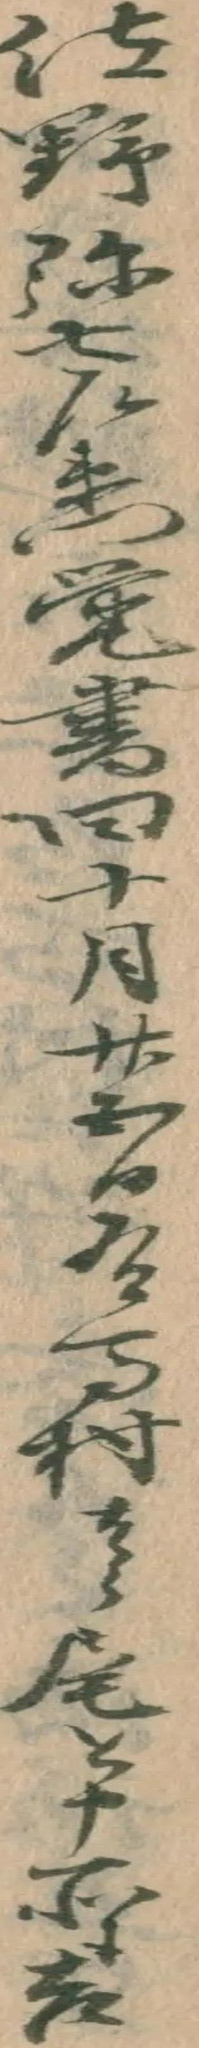佐野弥七左衛門覚書日十月廿五日有馬村さら？尾と申所も吉
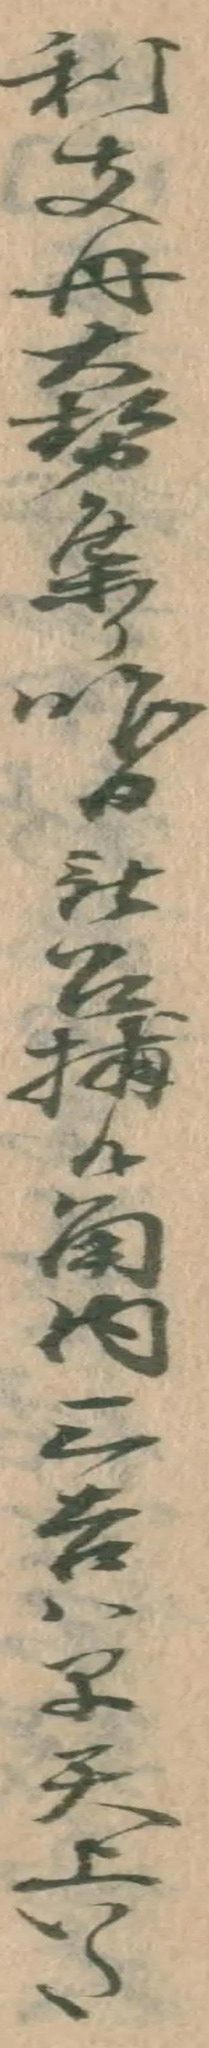利支丹大勢集り昨日被召捕候角内三吉は早天上いた
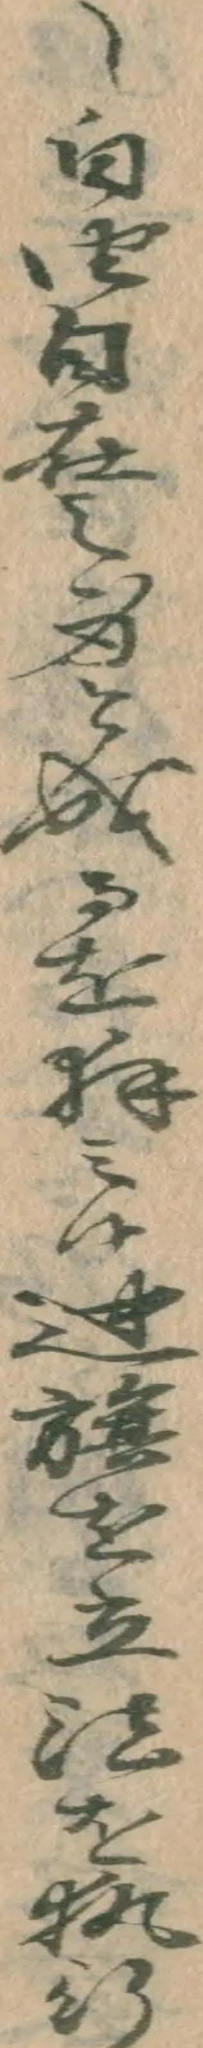し自由自在之身と成るを拝み候迚旗を立法を執行
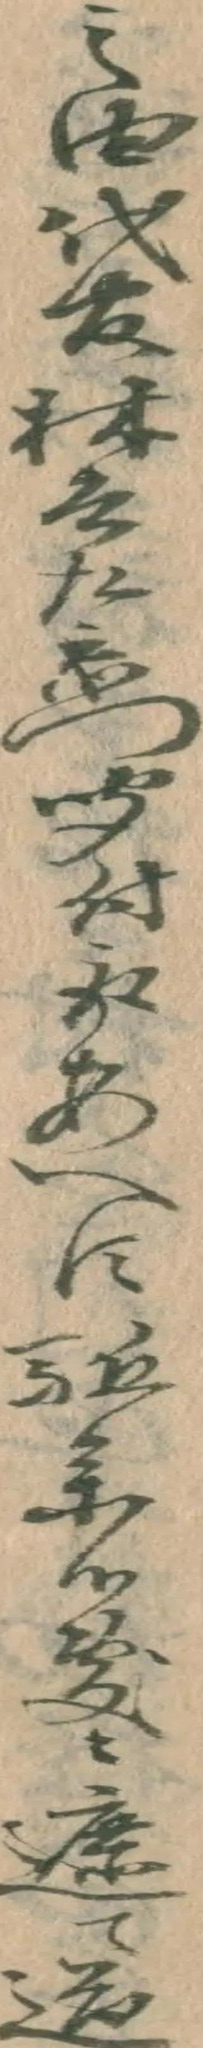之由代官林兵左衛門聞付取あへす駆参候処に遮て道
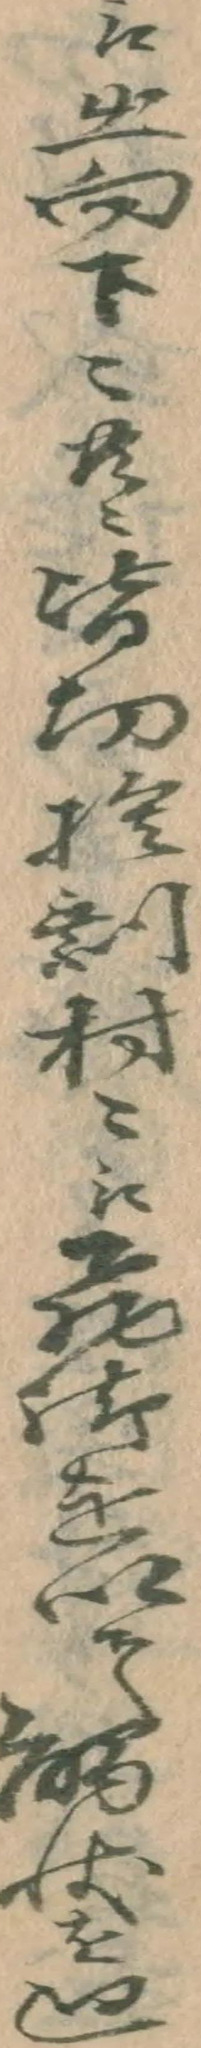え出向下々共に皆切捨剰村々え飛脚を以て触状を廻
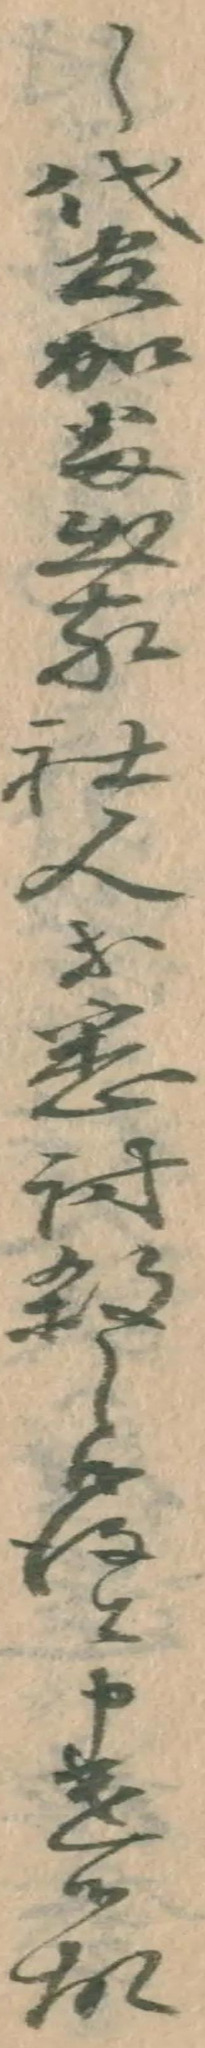し代官加番出家社人等悉討殺し候得と申遣候故
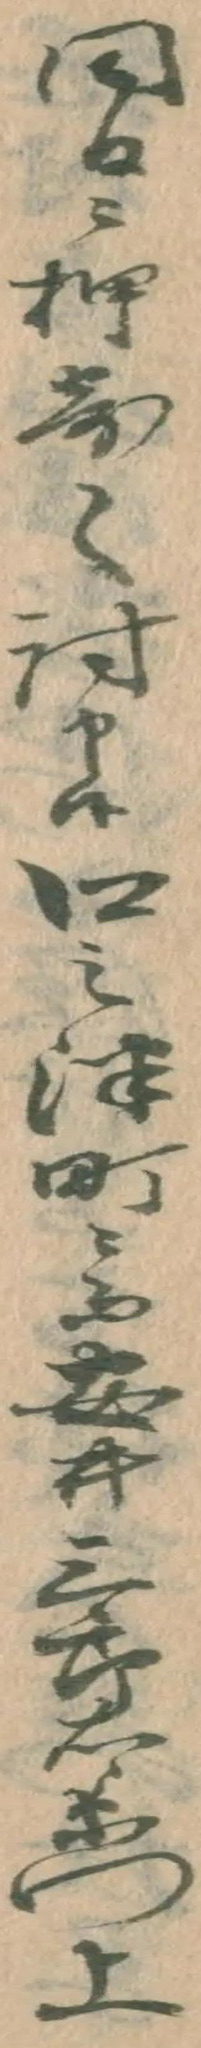同日に押寄て討申候口之津町に而安井三郎右衛門上

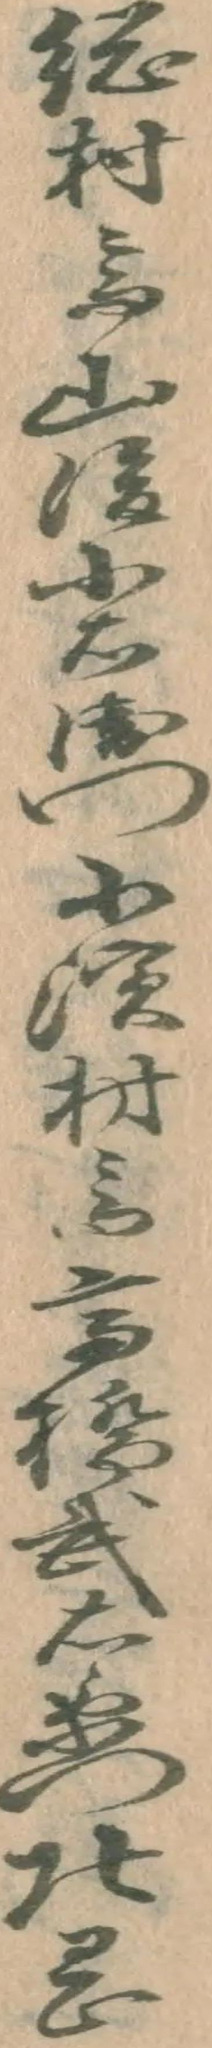総村に而山後小右衛門小浜村に而高橋武右衛門北岡
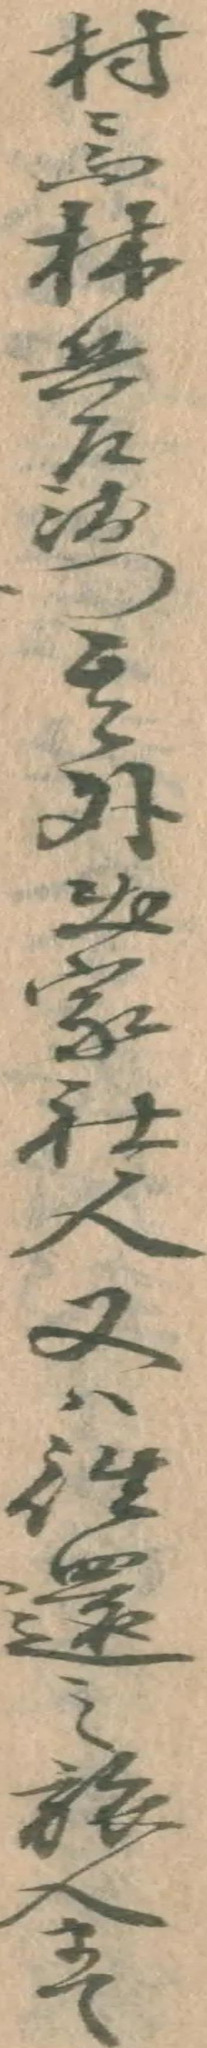村に而林兵左衛門其外出家社人又は往還之旅人まて
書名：切支丹御退治記 49巻. [1]
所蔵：国立国会図書館 National Diet Library, JAPAN
